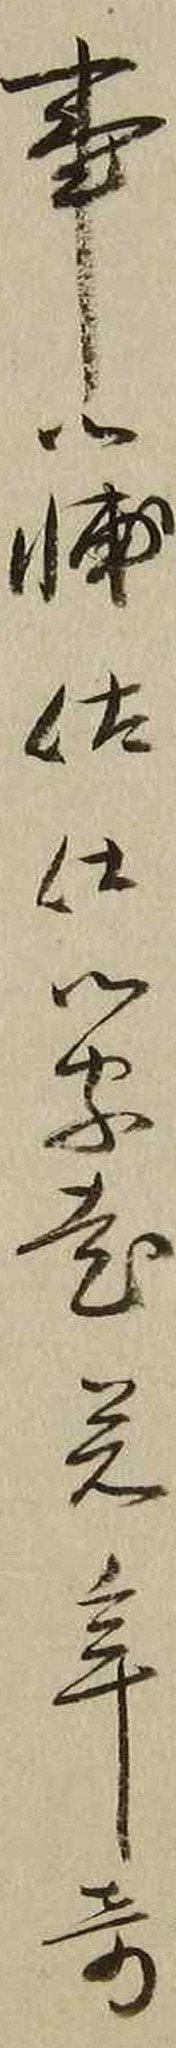事御補佐仕御家老若年寄
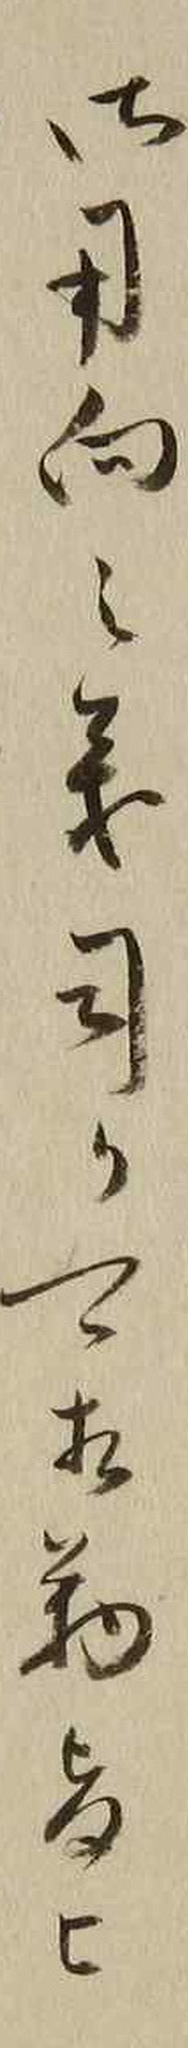御用向之義司り可相勤旨被
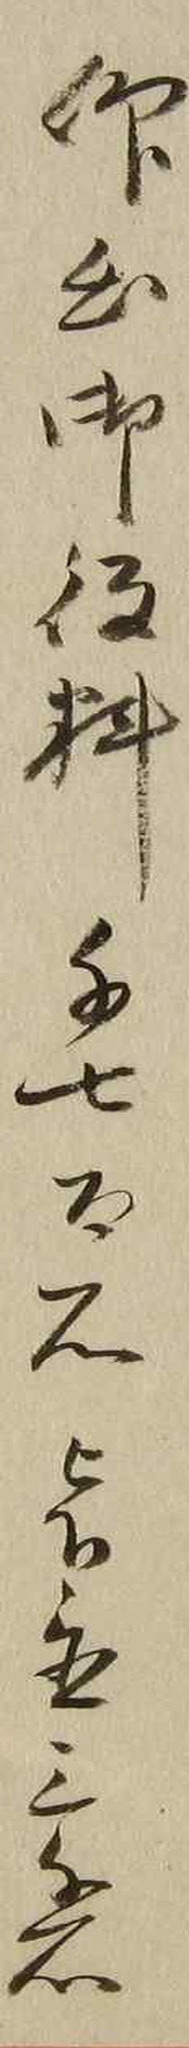仰出御役料千七百石被下置三千国
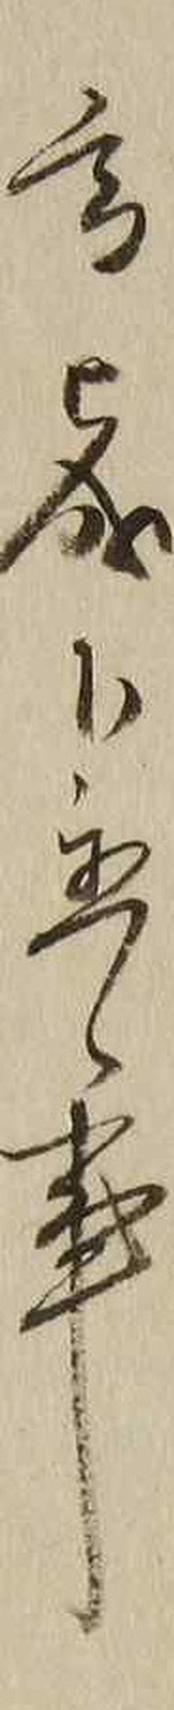高被成下置候事
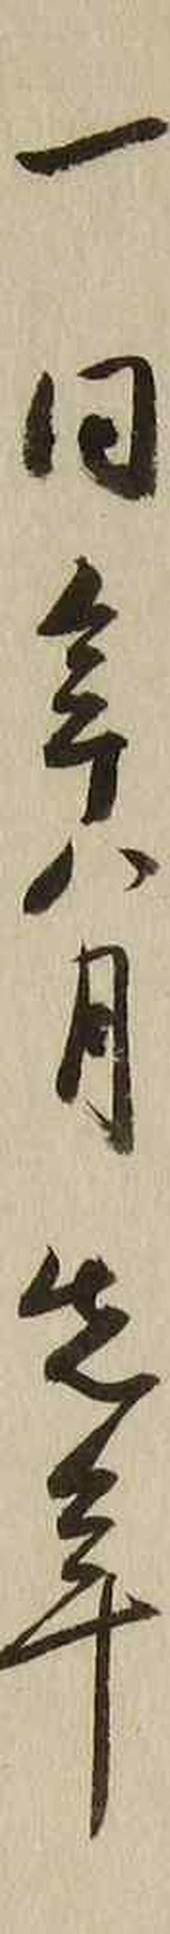一同年八月先年
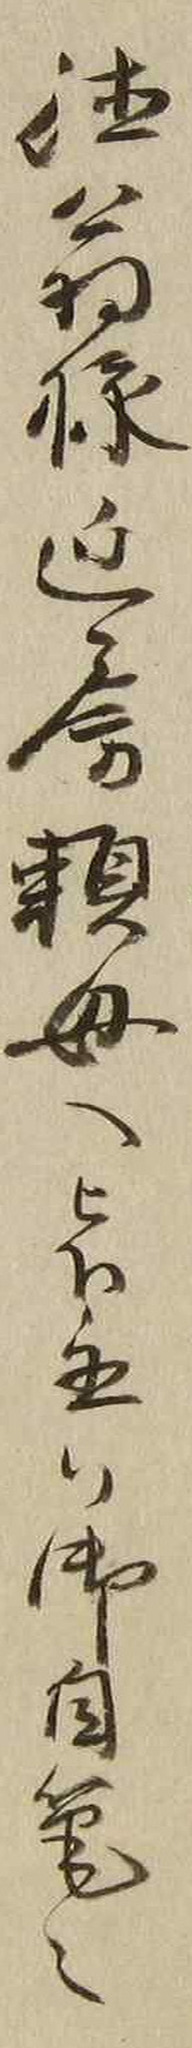徳翁様近房賴母へ被下置候御自筆之
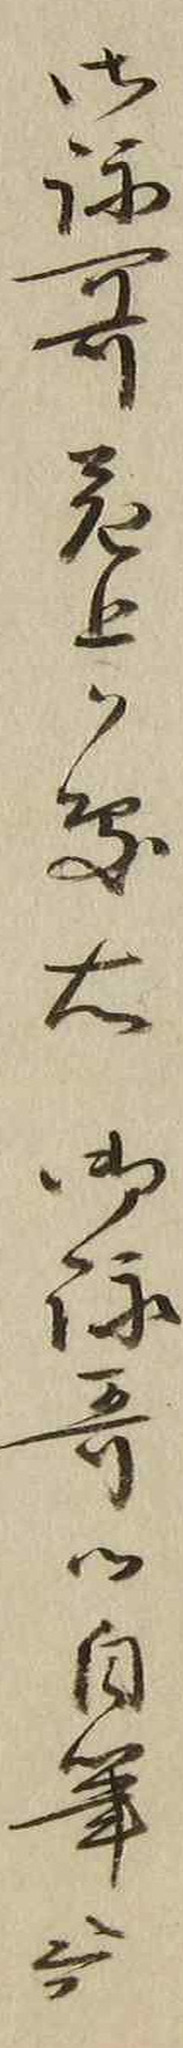御詠哥差上候処右御詠哥御自筆に而
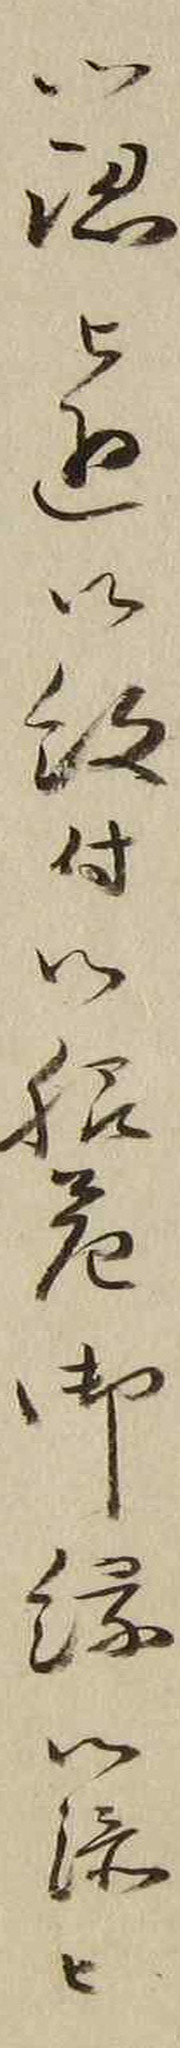御認被遊御紋付御脇差御縁御添被
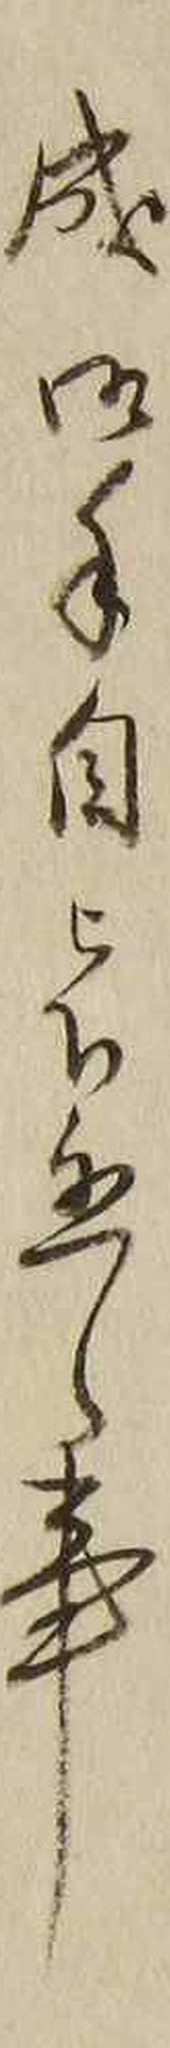成御手自被下置候事
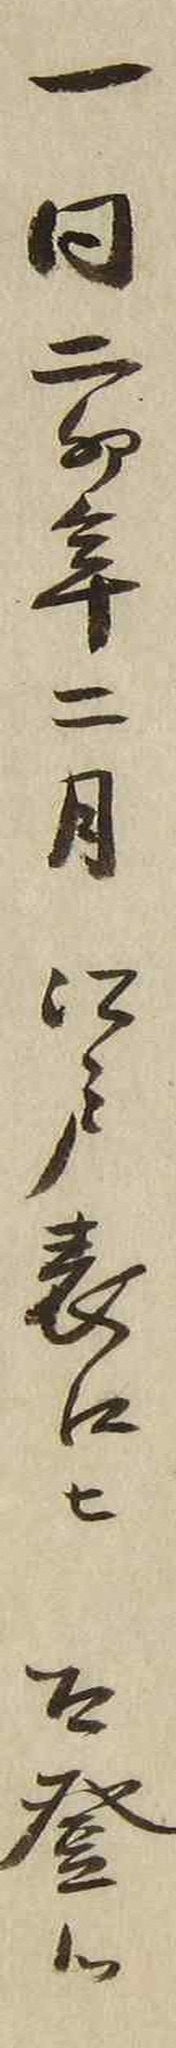一同二卯年二月江戸表江被召登候
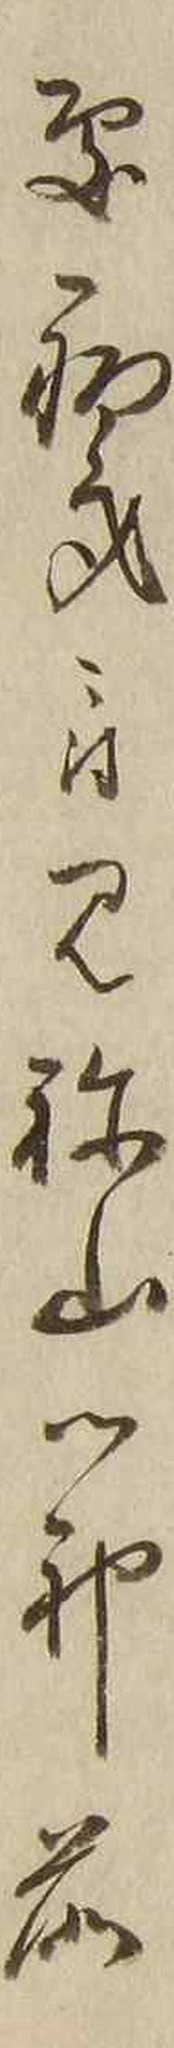処病身に付見禰山御神前

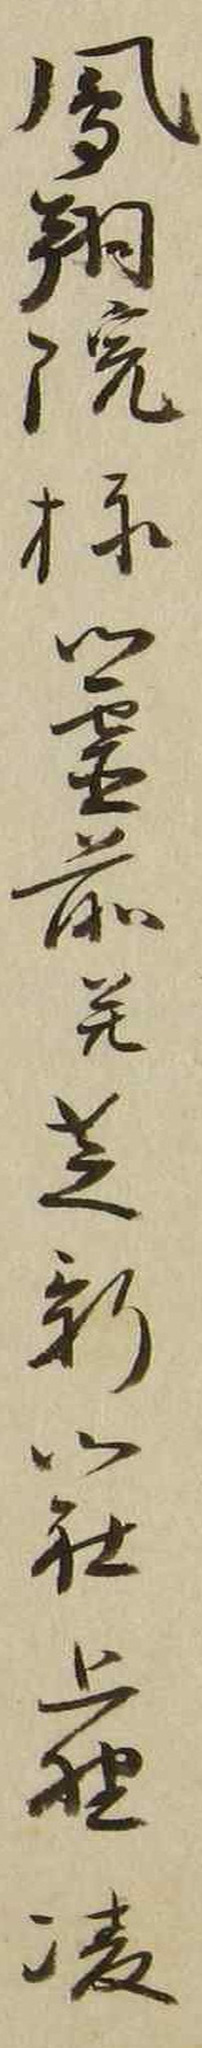鳳朔院様御霊前并芝新御社上野凌
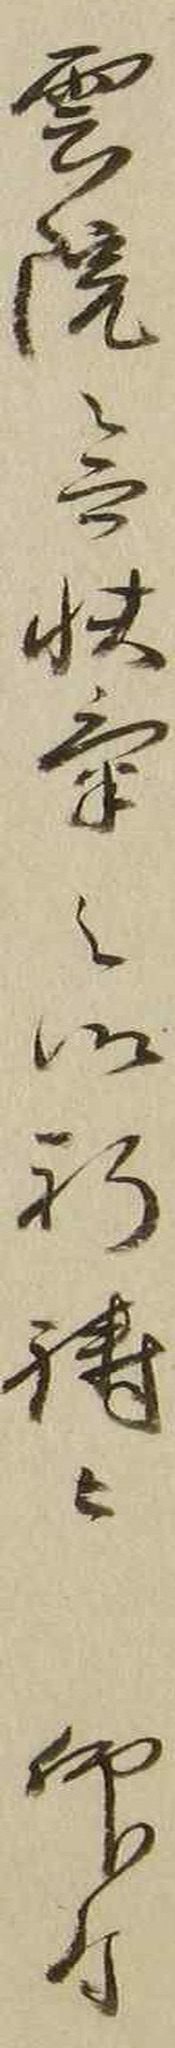雲院に而快気之御祈祷被仰付
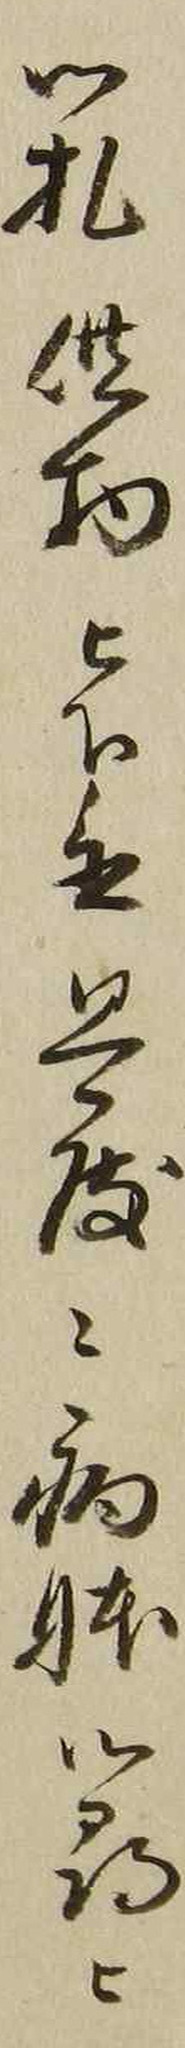御札供物被下置且度々病体御尋被
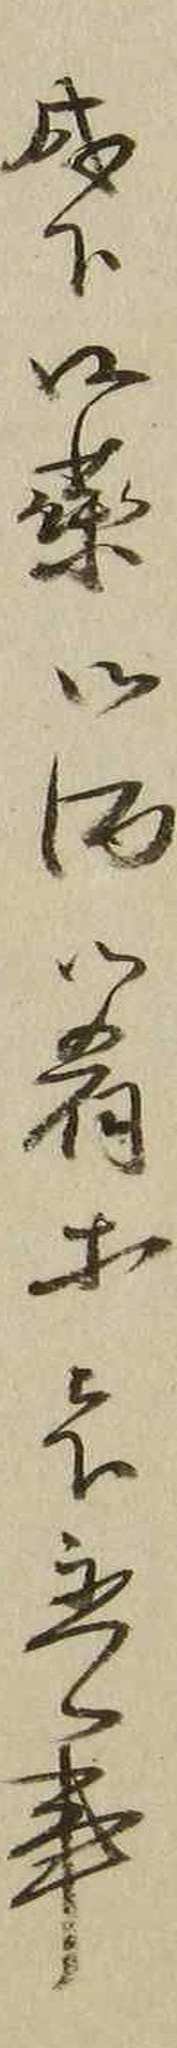成下御薬御酒御肴等被下置候事
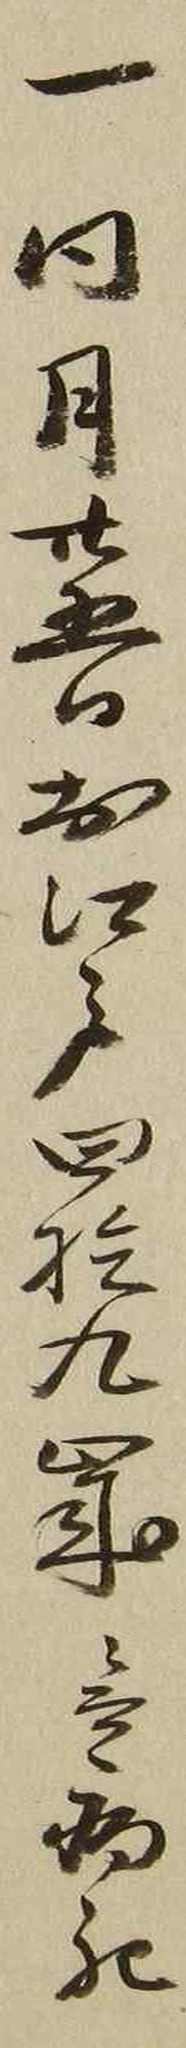一同月廿五日於江戸四拾九歳に而病死
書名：諸士系譜　巻之269　さ之部1
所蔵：会津若松市立会津図書館
